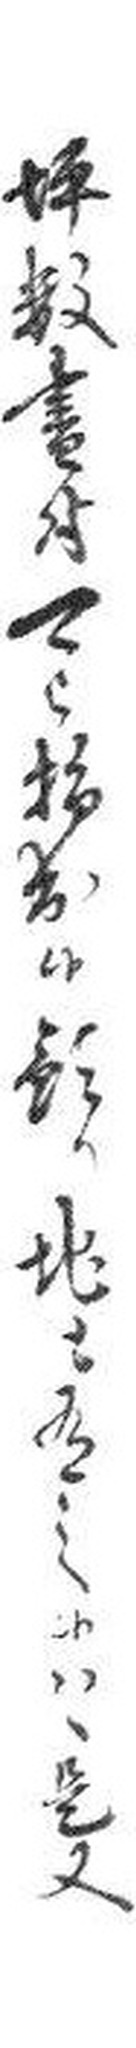坪数書付可被指出候預り地も有之候ハヽ是又
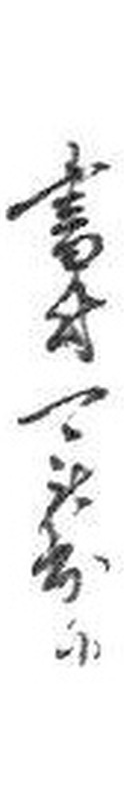書付可被出候
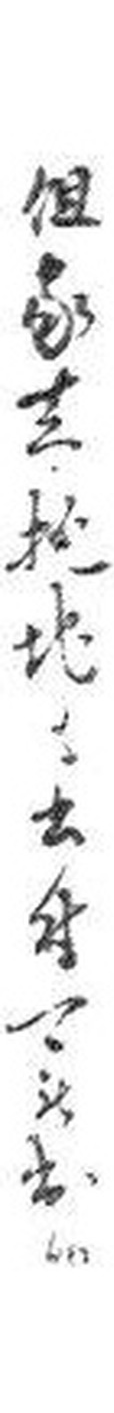但家来抱地も書付可被出候
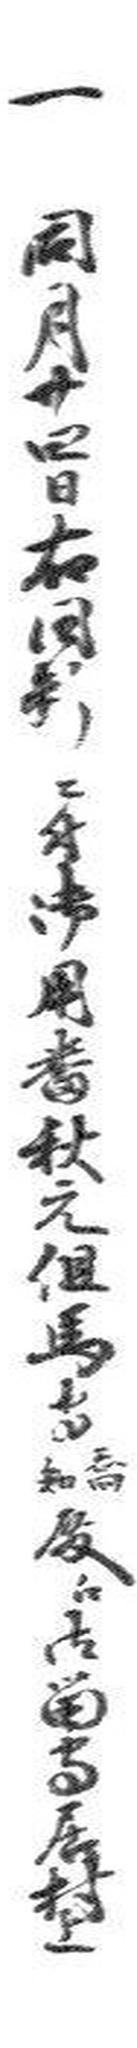一同月廿四日右同断ニ付御用番秋元但馬守喬知殿江御留守
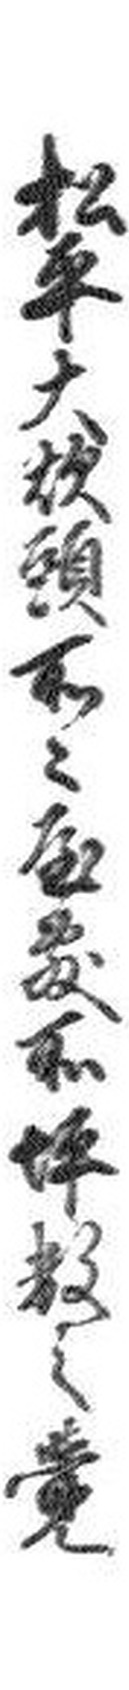松平大炊頭所々屋敷所坪数之覚
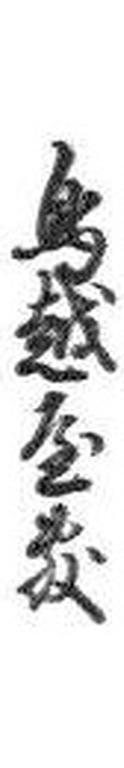鳥越屋敷
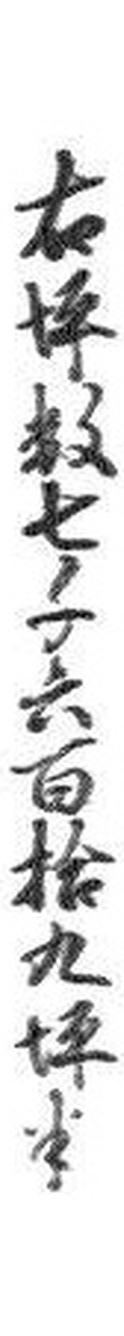右坪数七千六百拾九坪半
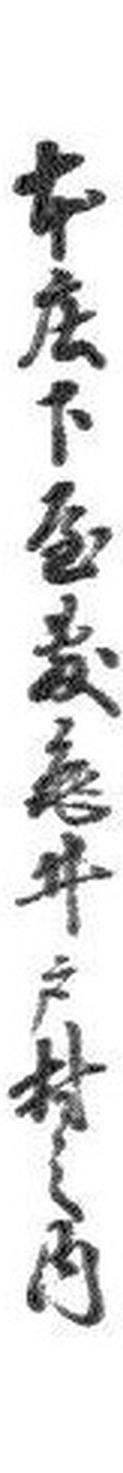本庄下屋敷亀戸村之内
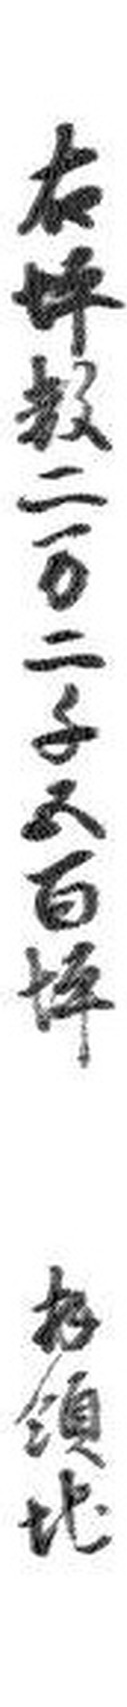右坪数二万二千五百坪拝領地
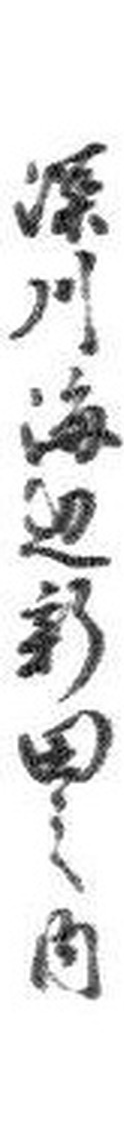深川海辺新田之内

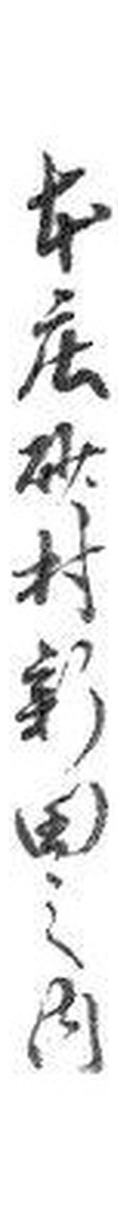本庄砂村新田之内
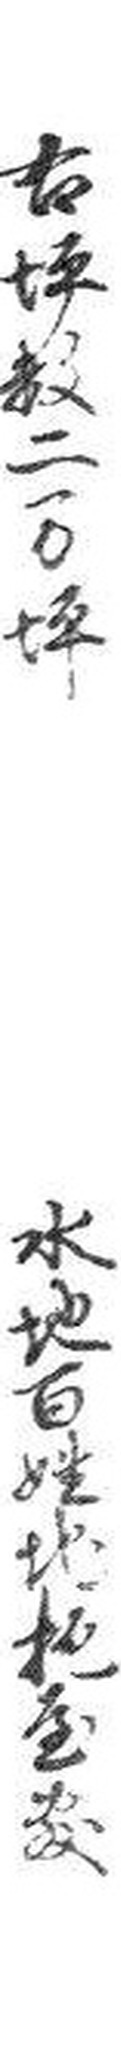右坪数二万坪水地百姓地抱屋敷
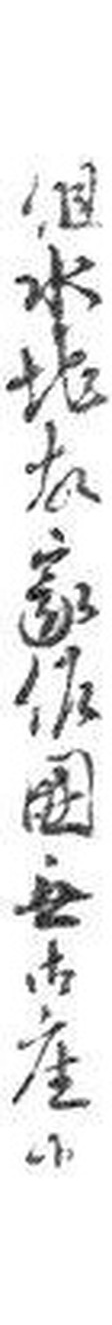但水地故家作囲無御座候
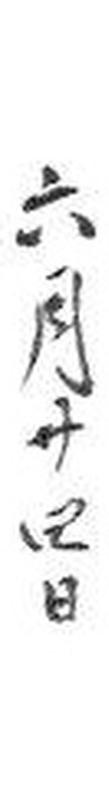六月廿四日
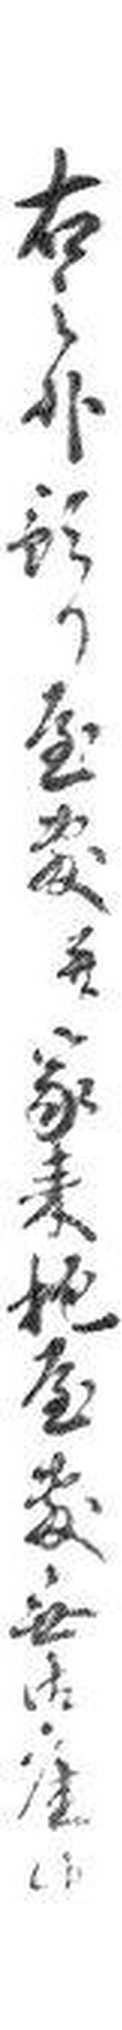右之外預り屋敷并家来抱屋敷無御座候
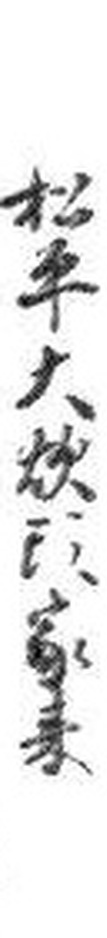松平大炊頭家来
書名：家譜 二十九 吉邦公 従正徳二年到正徳三年
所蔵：福井県文書館 Fukui Prefectural Archives
